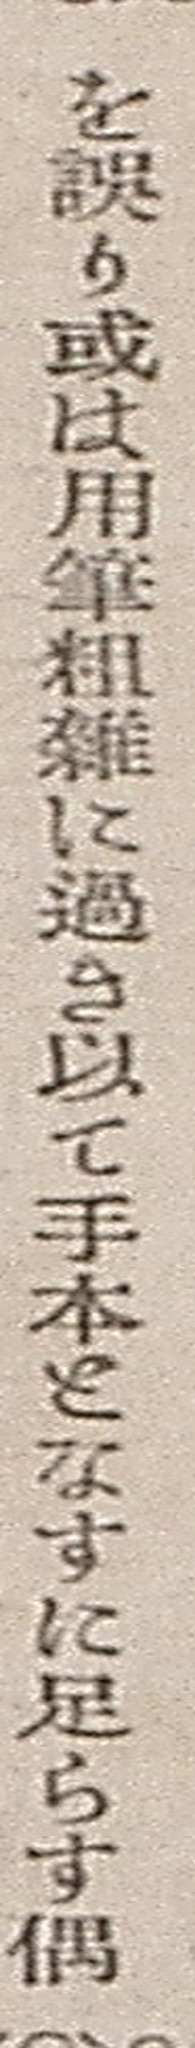を誤り或は用筆粗雑に過ぎ以て手本となすに足らず偶
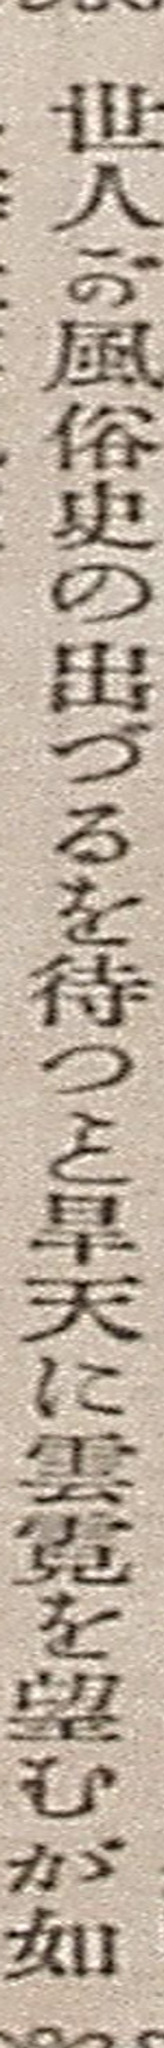世人が風俗の出づるを待つこと旱天に雲霓を望むが如
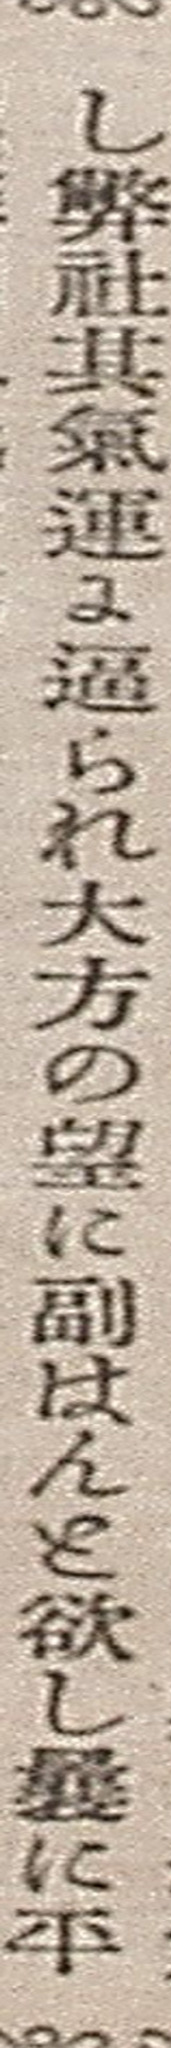し弊社其機運に逼られ大方の望に副はんと欲し曩に平
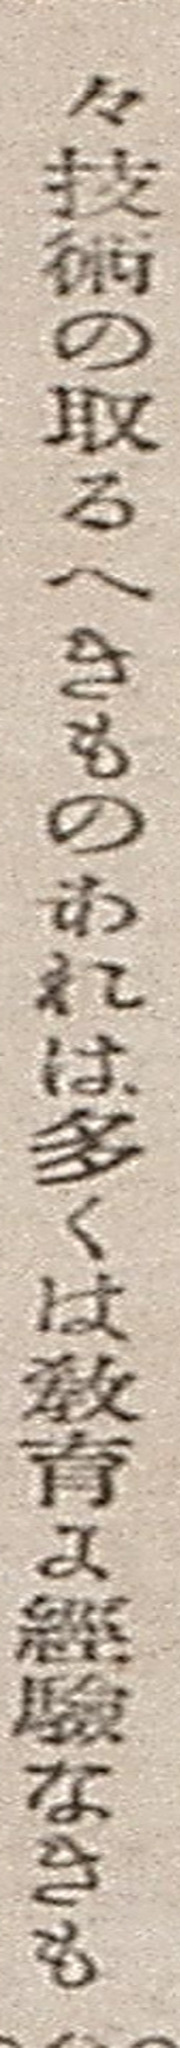々技術の取るへきものあれは多くは教育に経験なきも
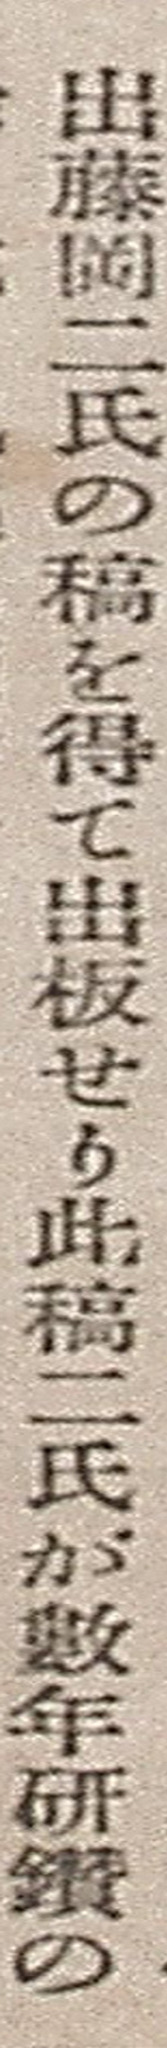出藤岡二氏の稿を得て出板せり此稿二氏が数年研鑽の
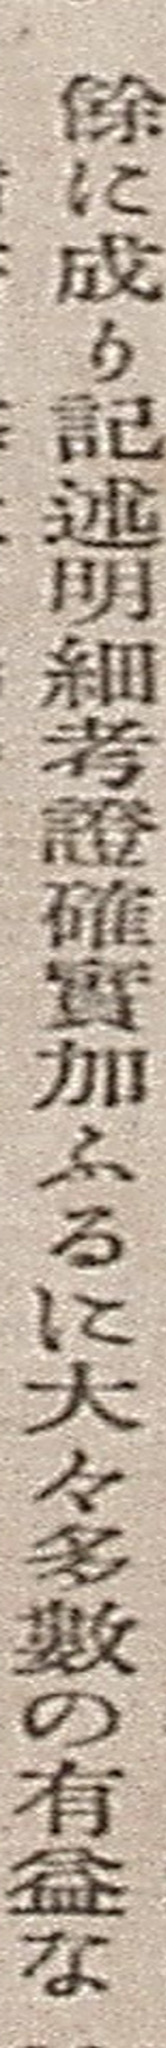餘に成り記述明細考證確実加ふるに大々多数の有益な
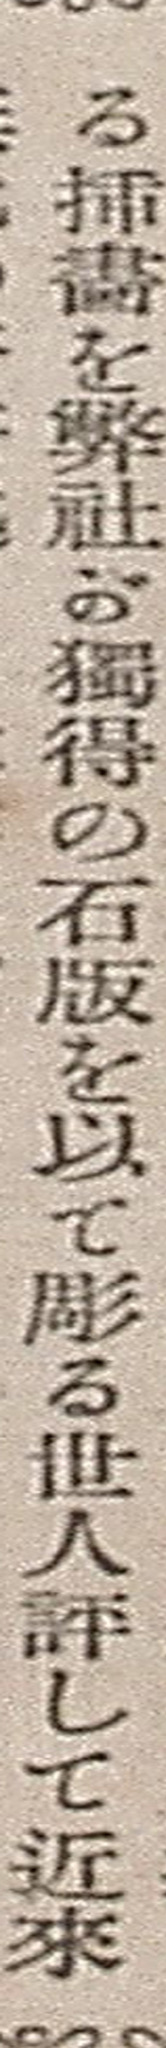る挿畫を弊社の独得の石版を以て彫る世人評して近来
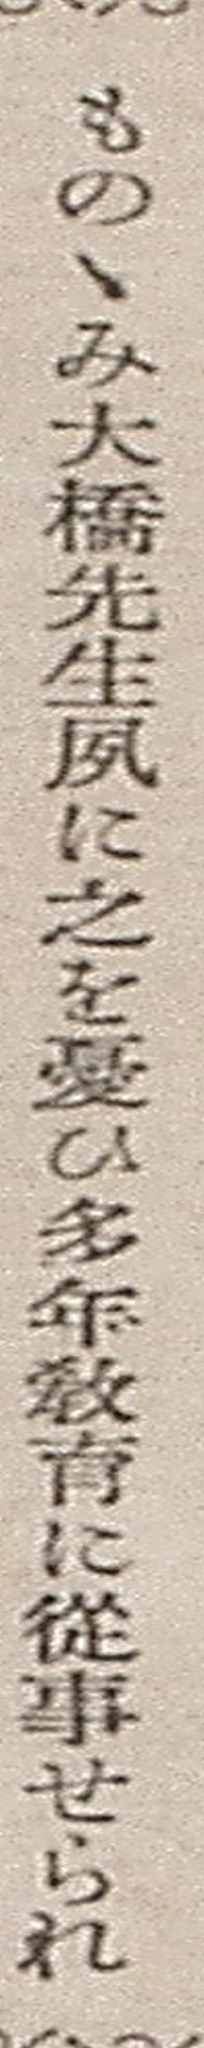のゝみ大橋先生夙に之を憂ひ多年教育に従事せられ
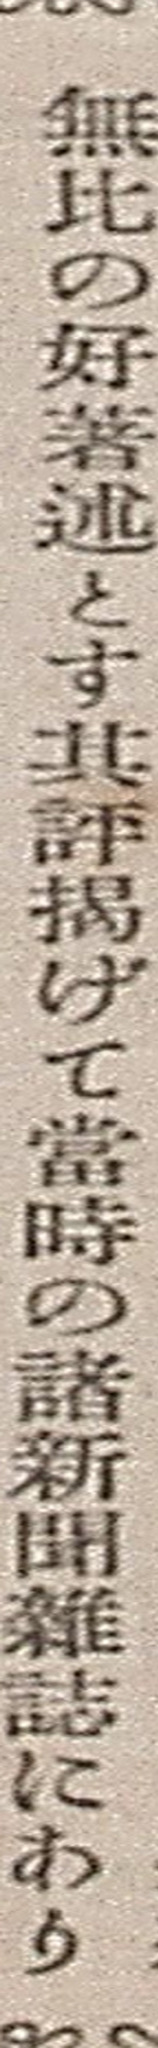無比の好著述とす其評掲げて当時の諸新聞雑誌にあり
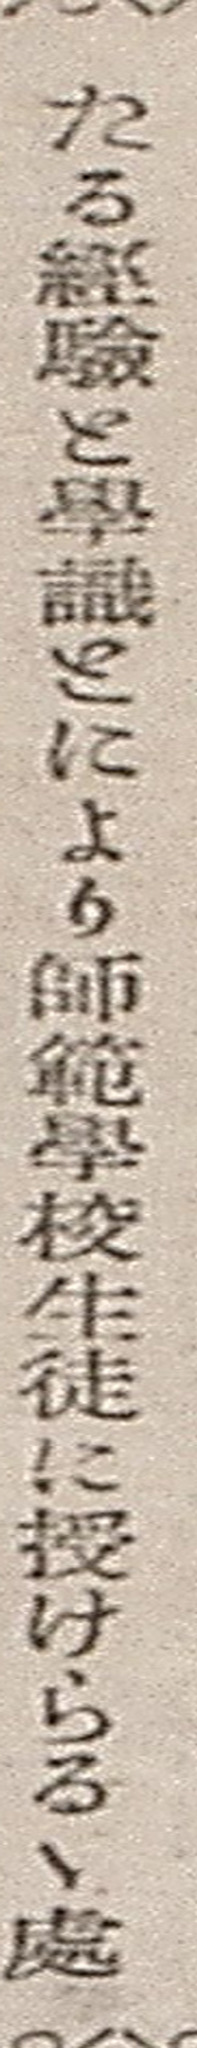たる経験と学識とにより師範学校生徒に授けらるゝ処
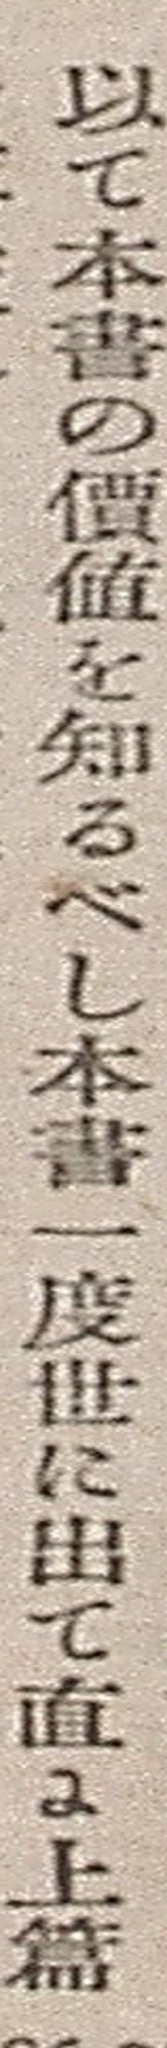以て本書の価値を知るべし本書一度世に出て直に上編
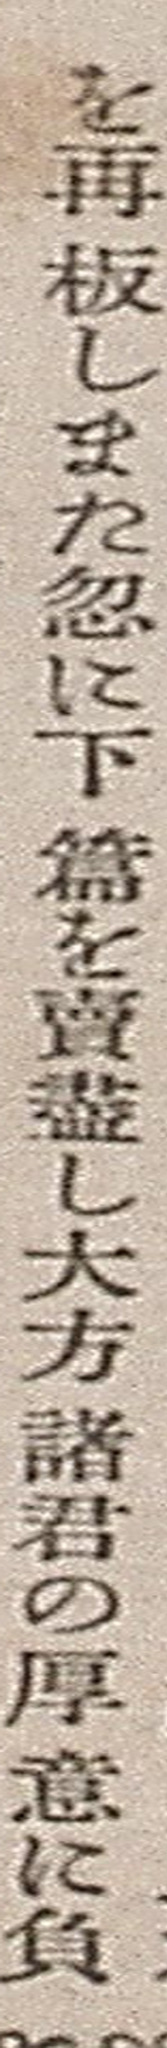を再板しまた忽に下編を売盡し大方諸君の厚意に負
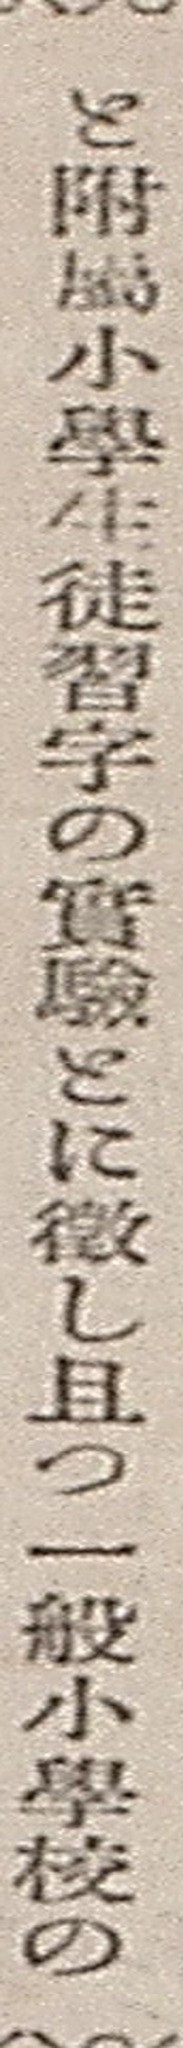と附属小学生徒習字の実験とに徴し且つ一般小学校の
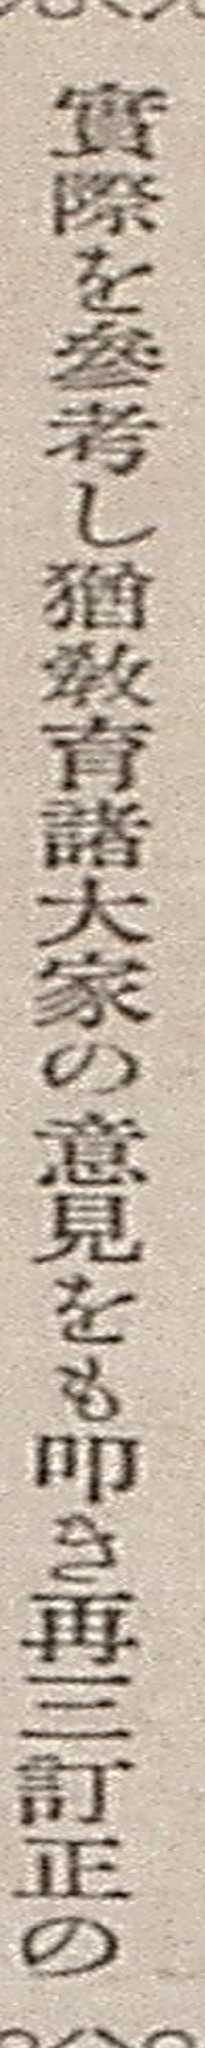実際を参考し猶教育諸大家の意見をも叩き再三訂正の
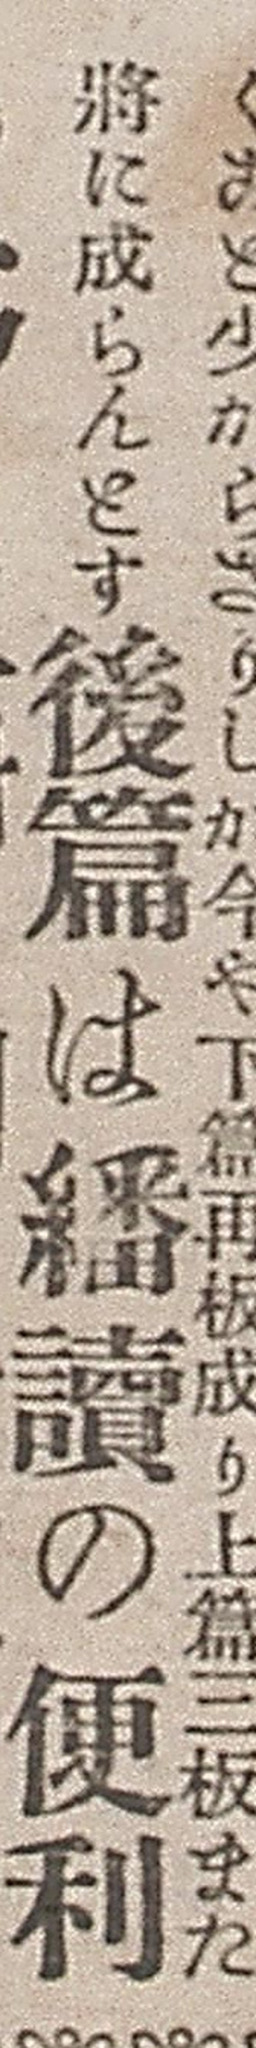将に成らんとす後編は繙読の便利
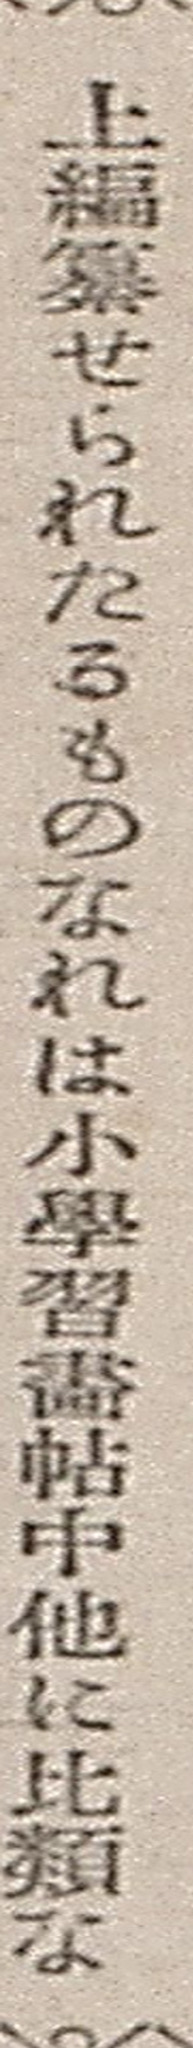上編纂せられたるものなれば小学習畫帖中他に比類な
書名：風俗畫報臨時増刊第百二十六號　洪水被害録（中）
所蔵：東京大学地震研究所図書室 Earthquake Research Institute Library, The University of Tokyo, JAPAN
